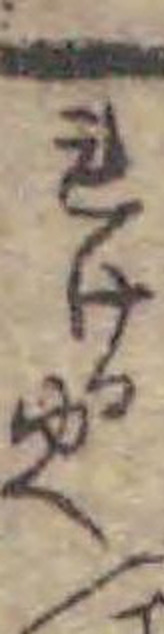れけるゆへ
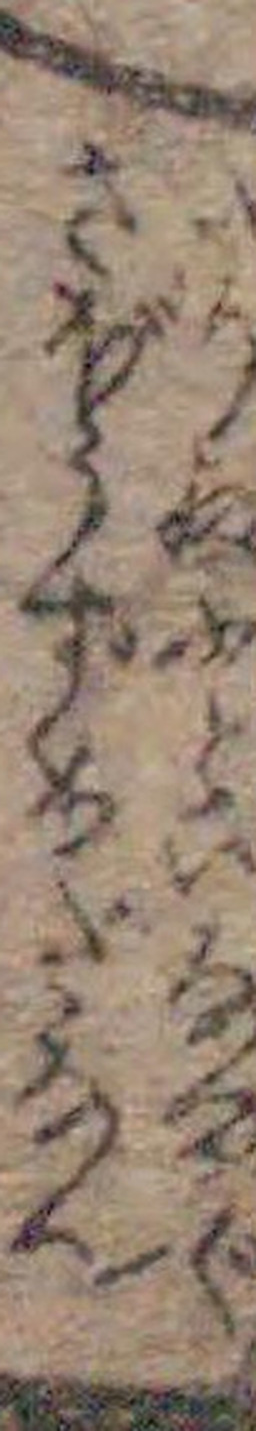さぼうずめだなん
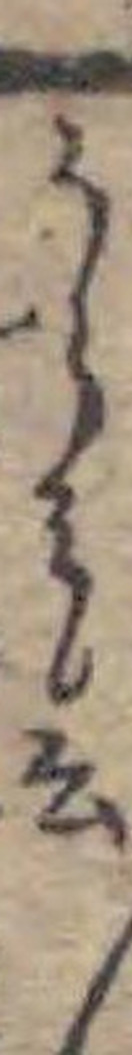うらみも云
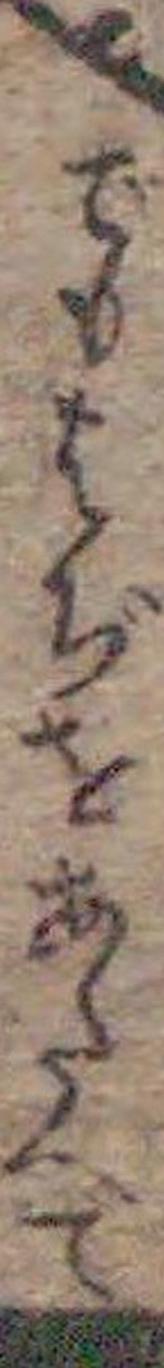でもはぢをあたへて
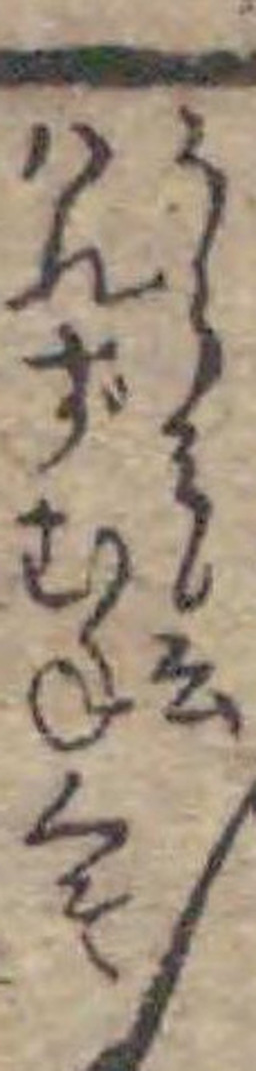はれずむねくそ
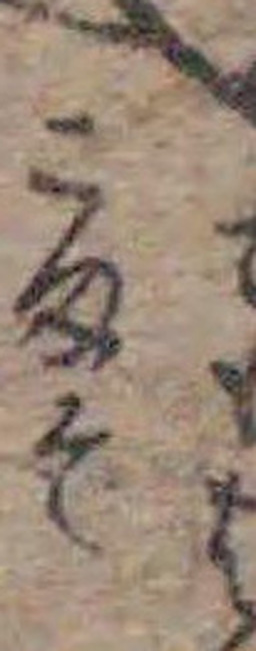こまそ
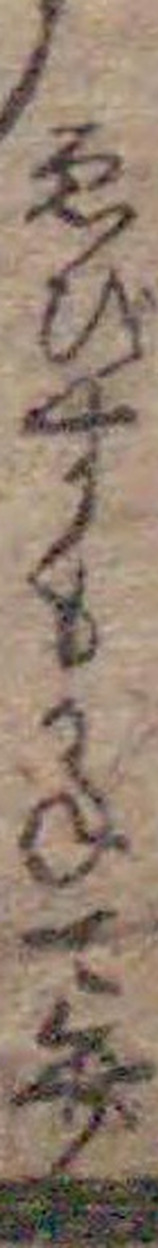ゑびすもかねて弁
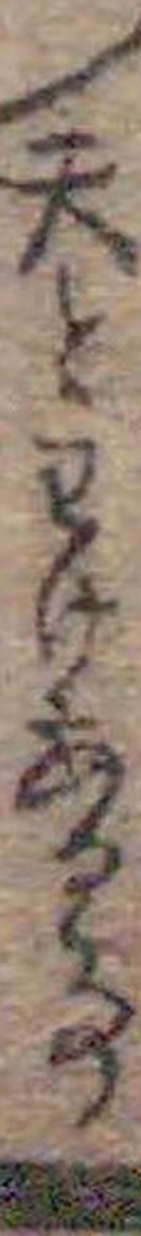天とわけある事
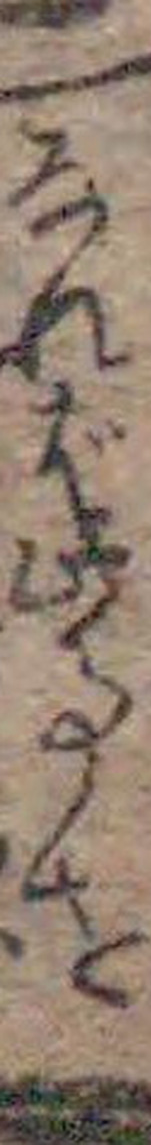なれば此事を
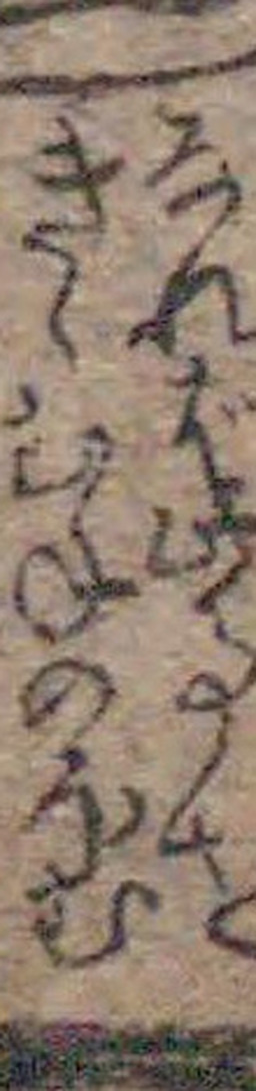きゝむねのほむ
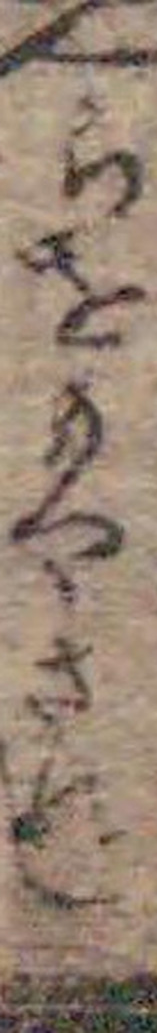らをもやされし
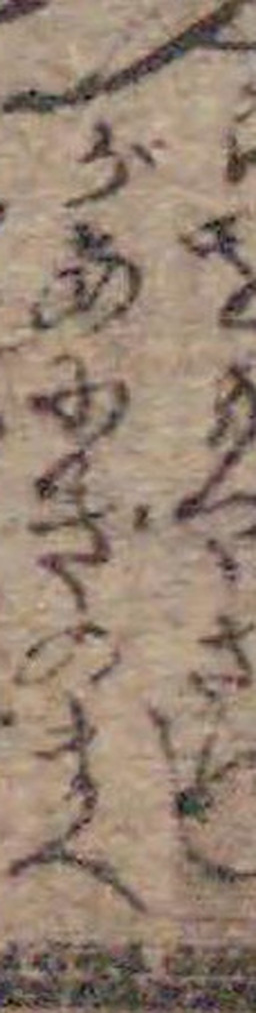があにきのまへ
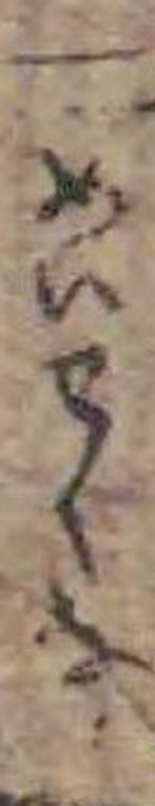めいわくな
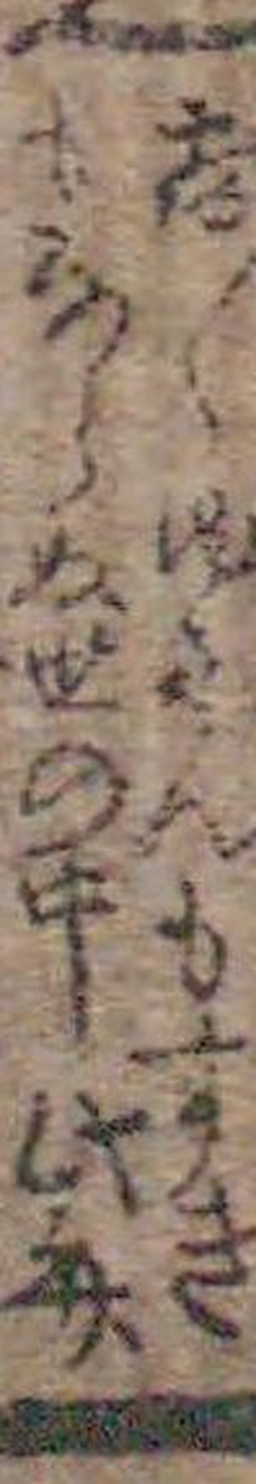もならぬ世の中此弁
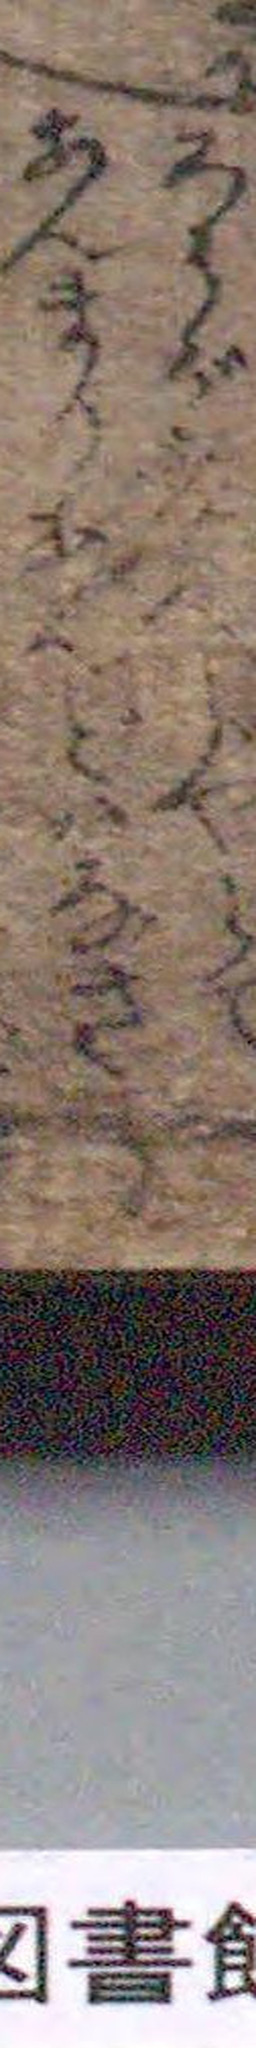あんまりあんとはなさ

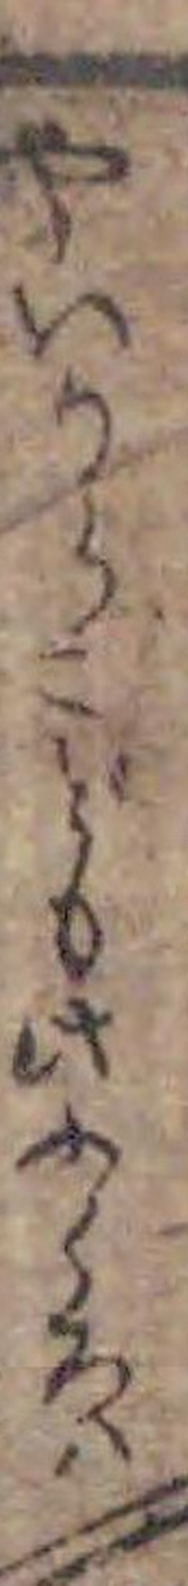やいからこども此ふくろは
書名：蛭子大黒壮年過 : 2巻
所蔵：国立国会図書館 National Diet Library, JAPAN
